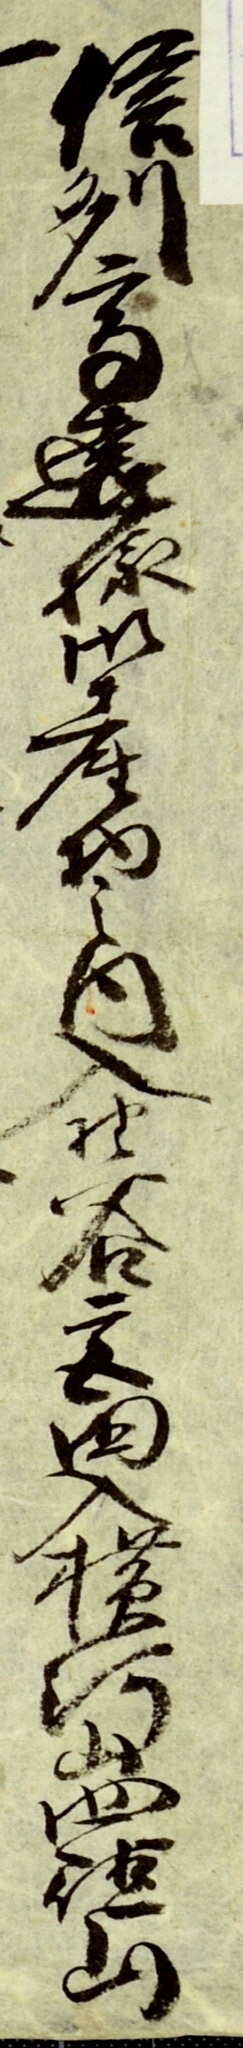信州高遠様御産物之内入墅谷宮田入横河山四徳山
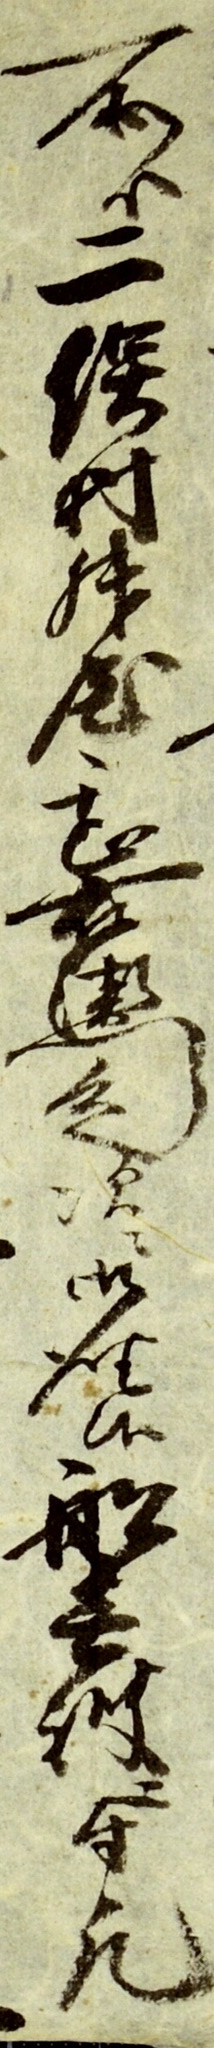所江二俣村妹尾甚右衛門取次ニ御座候船壱艘ニ付凡
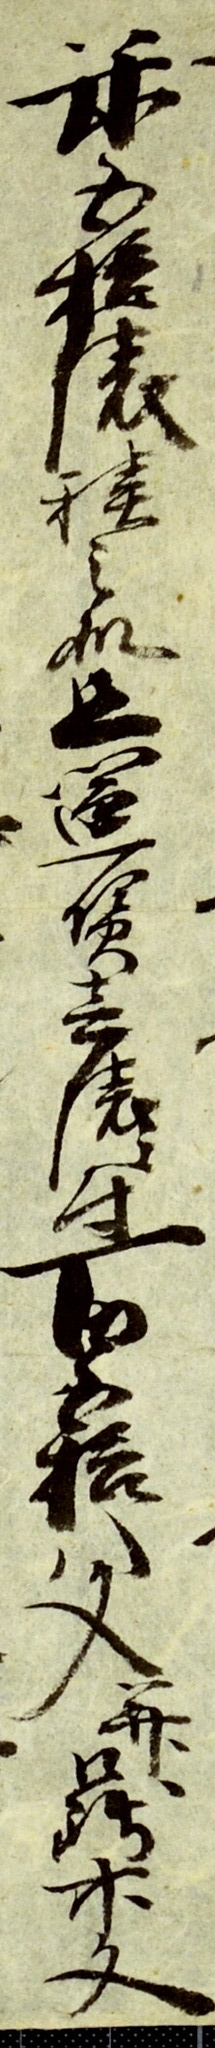米五拾俵積之処且運賃壱俵ニ付百五拾八文并口銭廿文
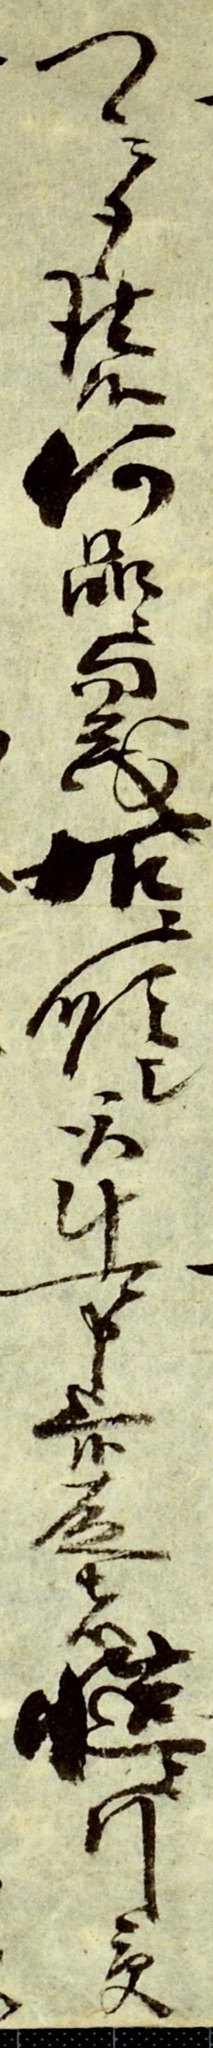つゝニ御座候何品ニ而も右ニ順シ取計可申上候故者慥ニ引受
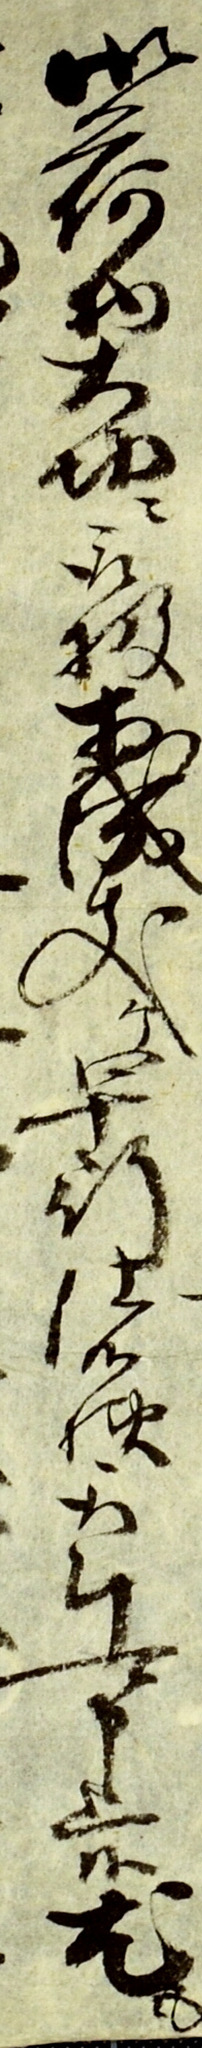御荷物大切ニ取扱相成丈ケ早行仕候様取計可申上候尤も
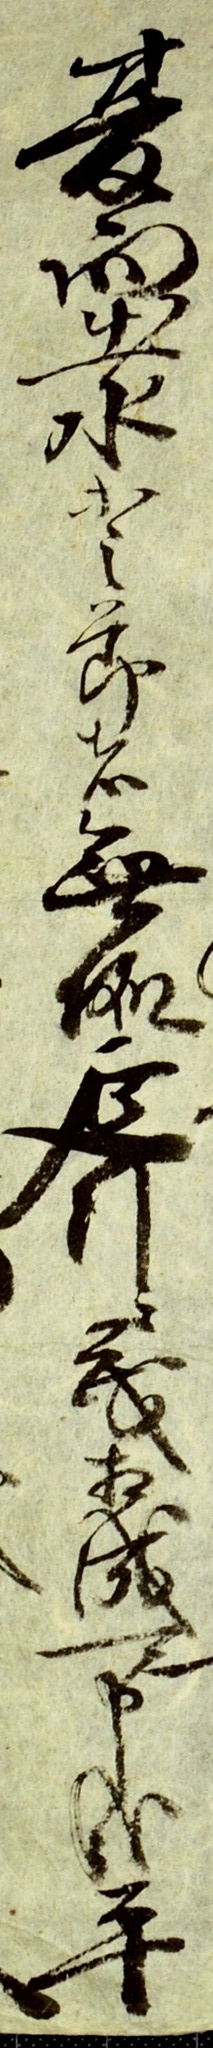夏而出水等之節者無處延引ニも相成可申哉平
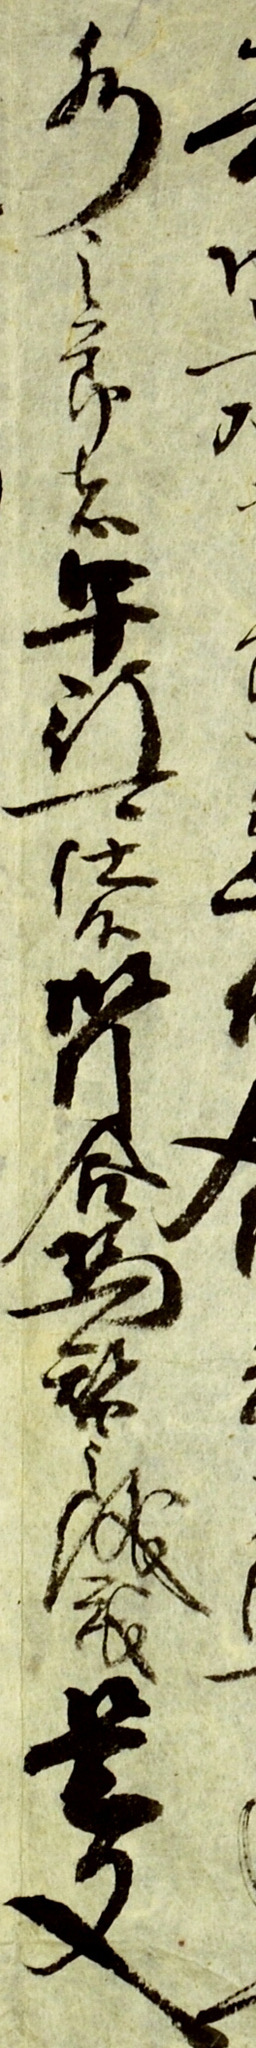水之節者早行可仕候御引合為替之儀も是又
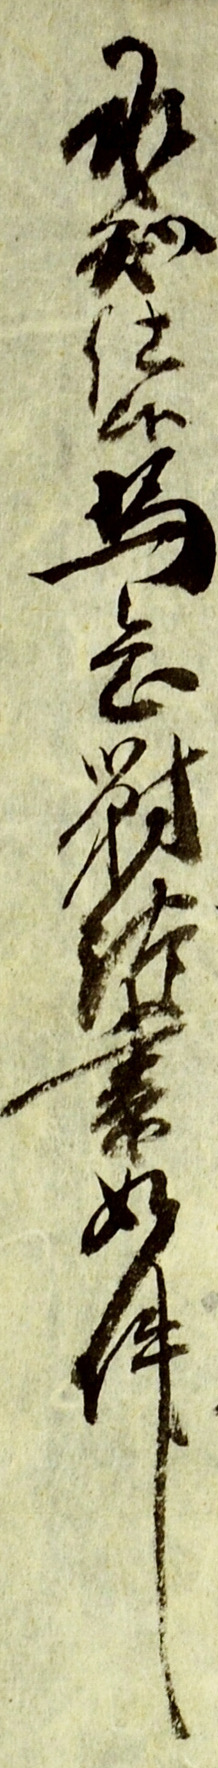承知仕候為念対談書如件
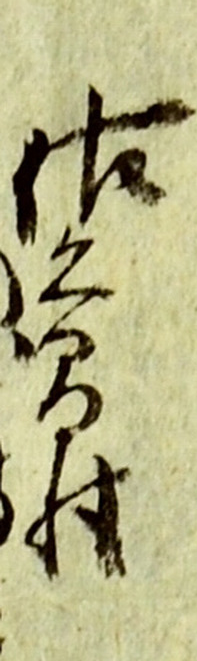佐久間村
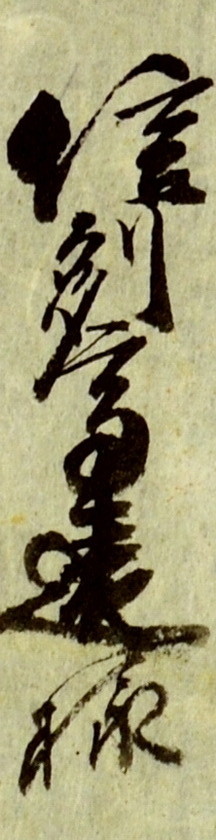信州高遠様
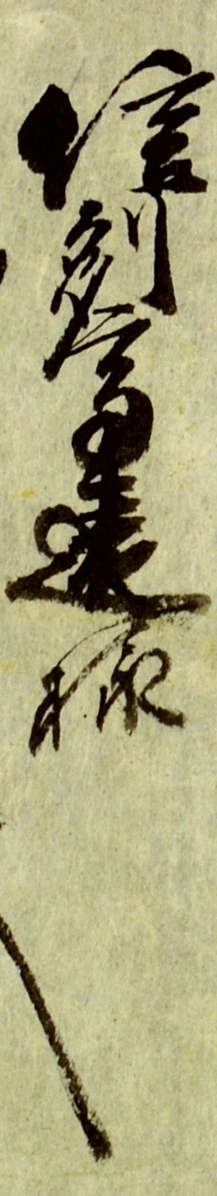信州高遠様
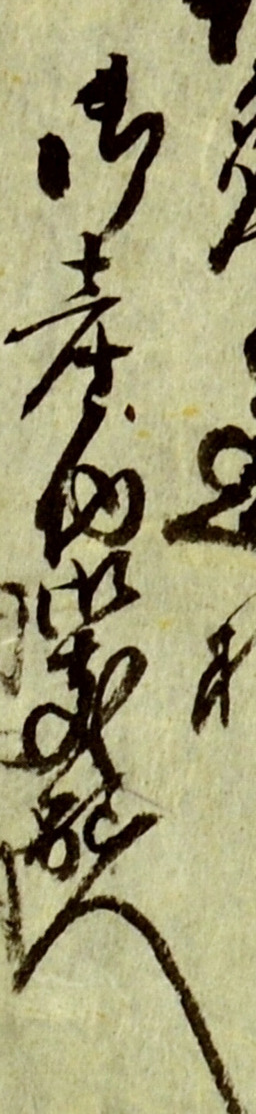御産物御支配人
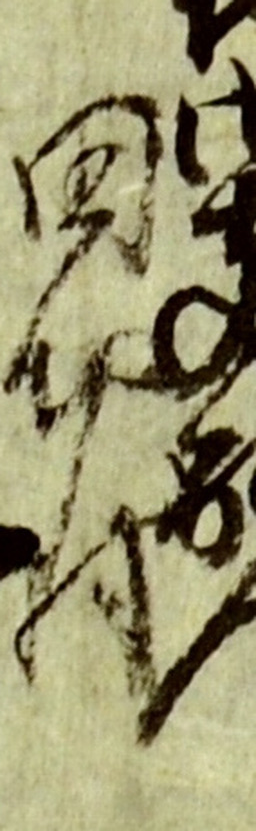田切村
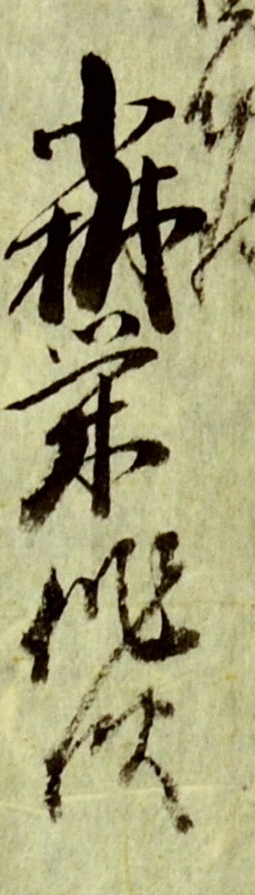小林栄作様
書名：差上申一札之事
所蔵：伊那市立高遠町図書館・合同会社AMANE
